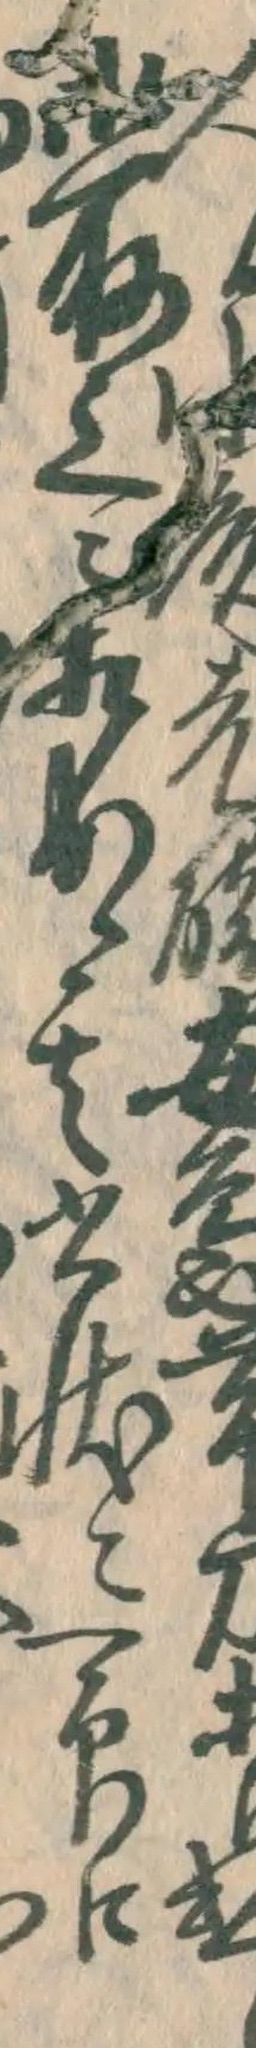御取上ニ相成候其書状二天下江
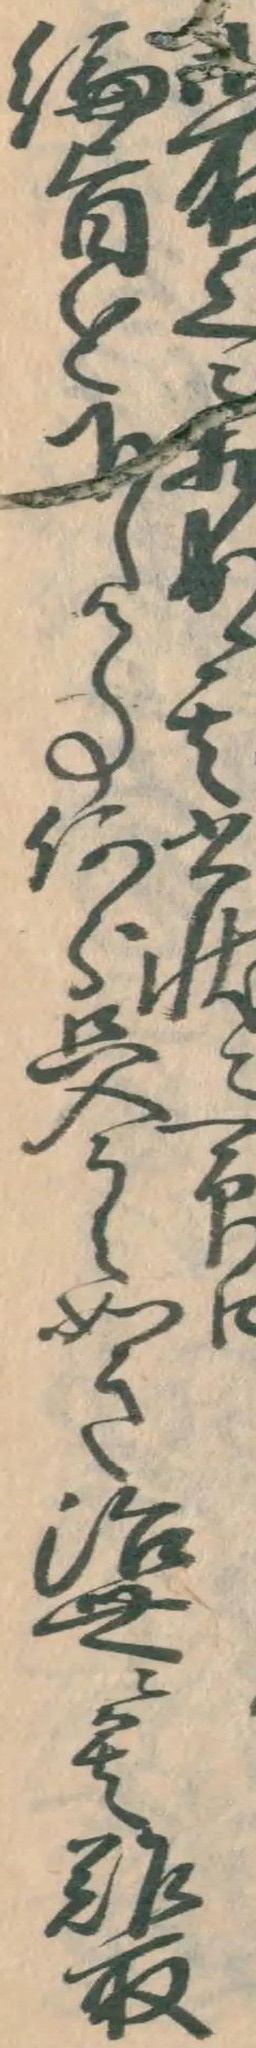綸旨を下し候事何分只今之如き治世ニ而者難取

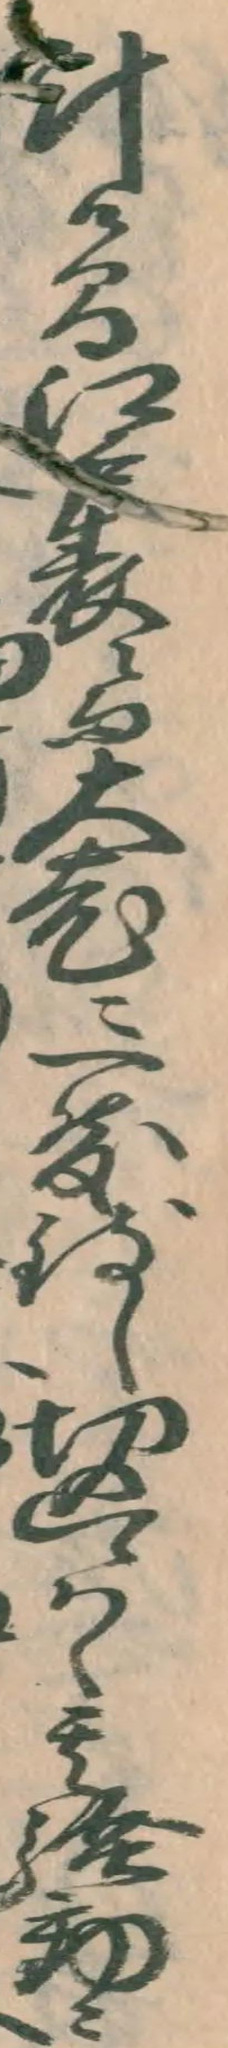計候間江戸表二而大老ニ一発致し切込候ハヽ其騒動ニ
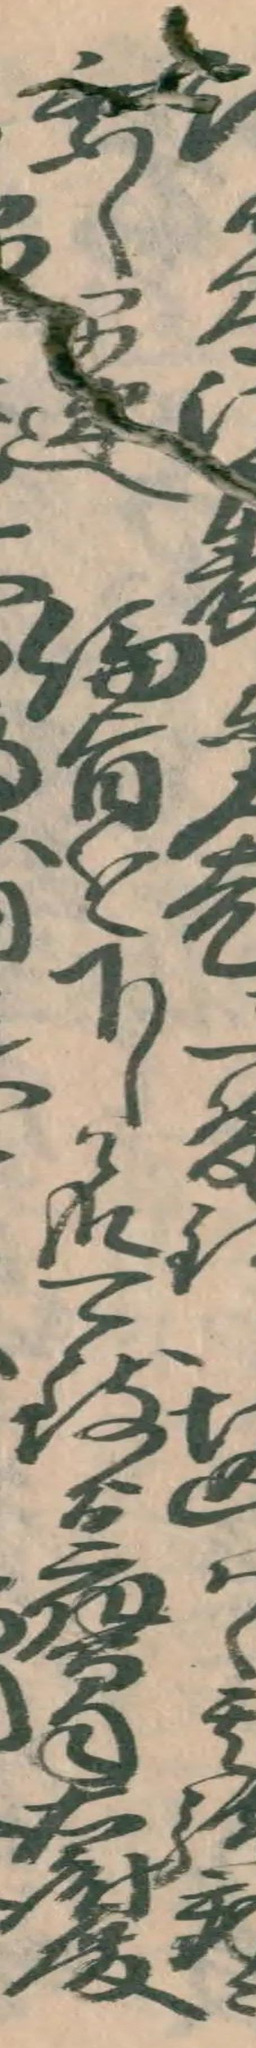乗し早速綸旨を下し候様可致旨鷹司右府殿
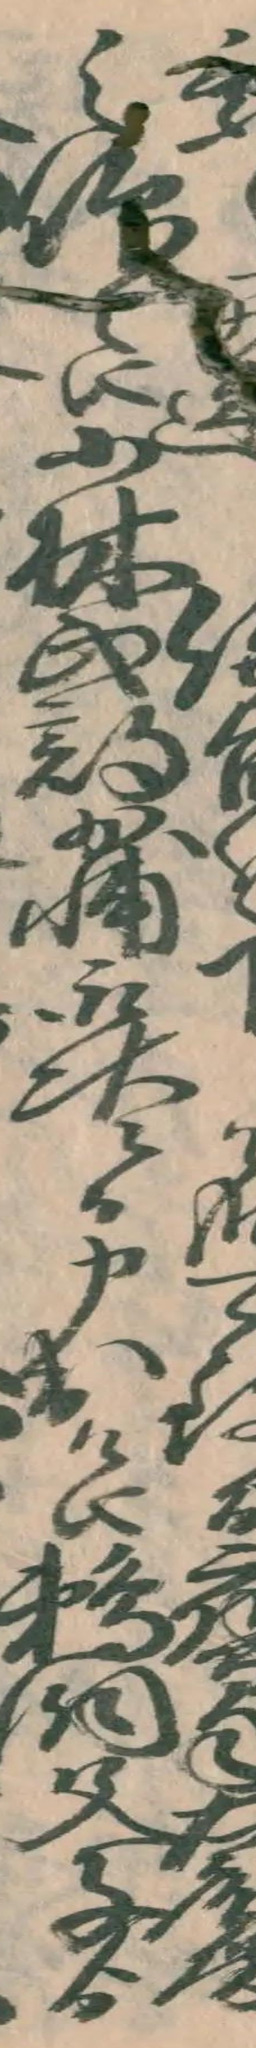被仰候由小林民部少輔取次ニ而申出候由鵜飼父子ゟ
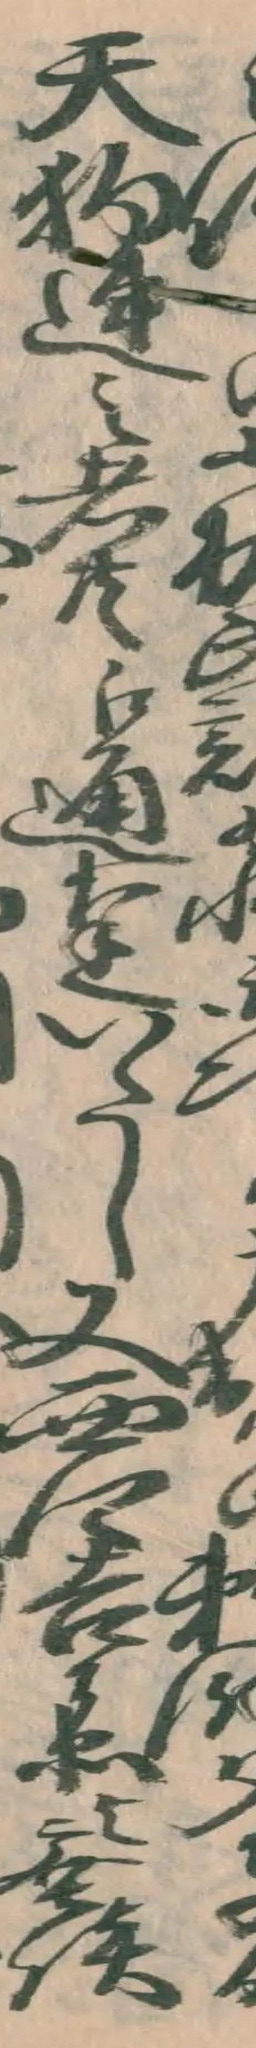天狗連之者共江通達いたし又西郷吉兵衛と蜜談
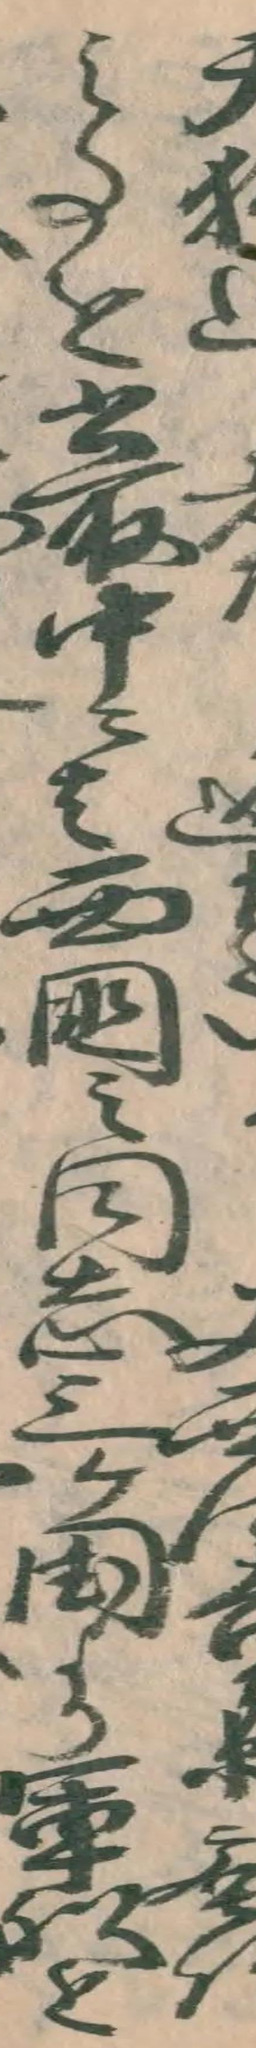之事を書取中ニ者西国之同志三ケ国より軍船を
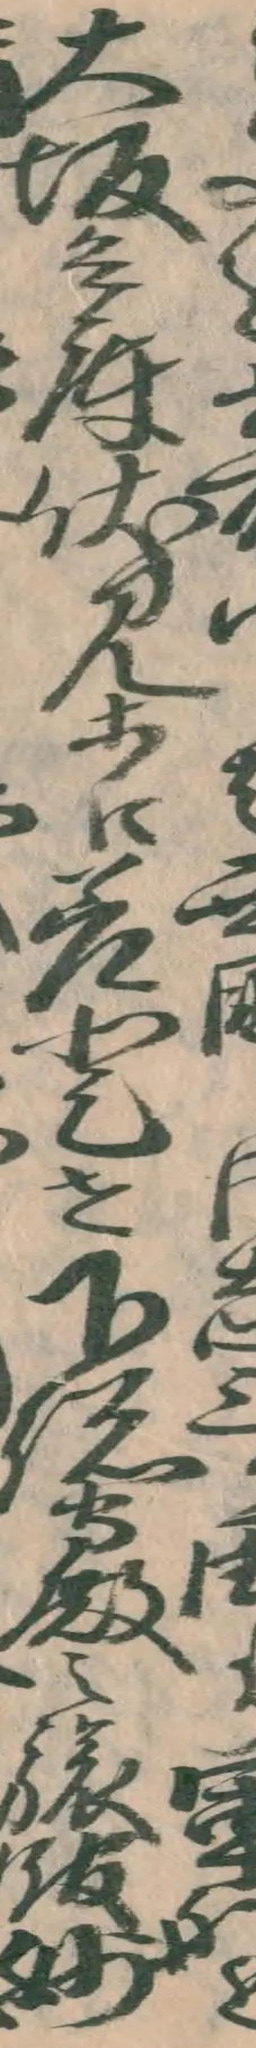大坂兵庫伏見等江差登せ下総守殿之旅館妙
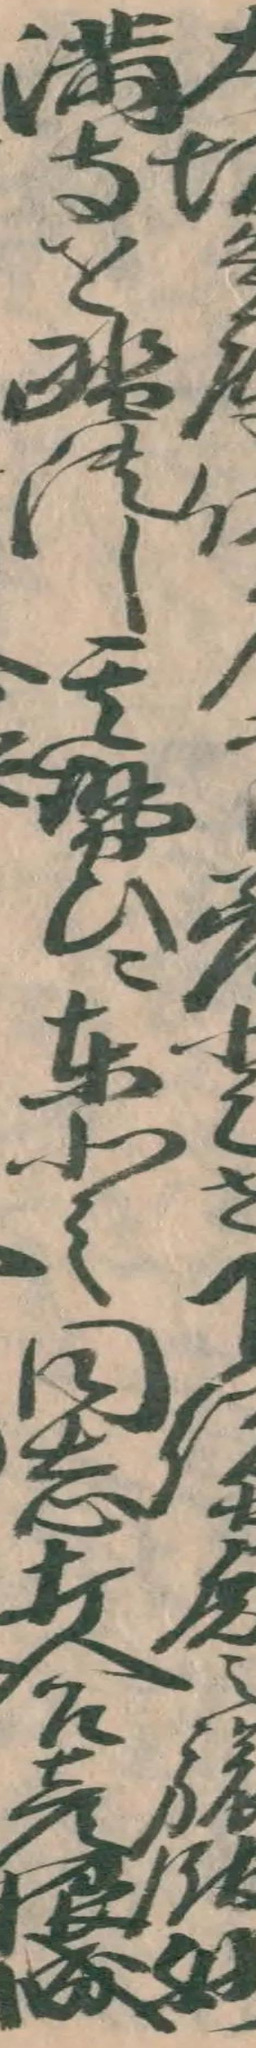満寺を踏潰し其勢ひニ東北之同志打合彦根城
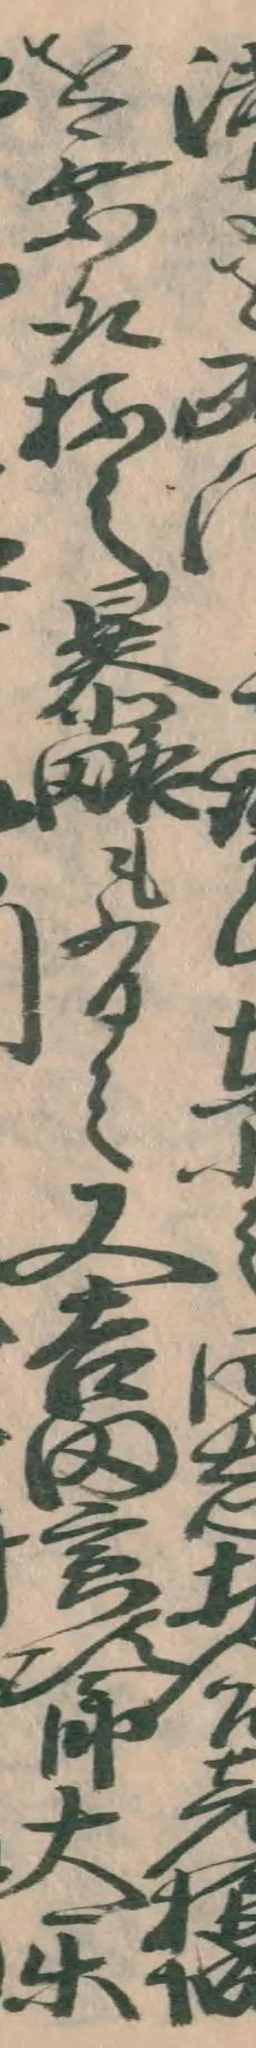を乗取抔之暴略も有之又吉田寅次郎大楽
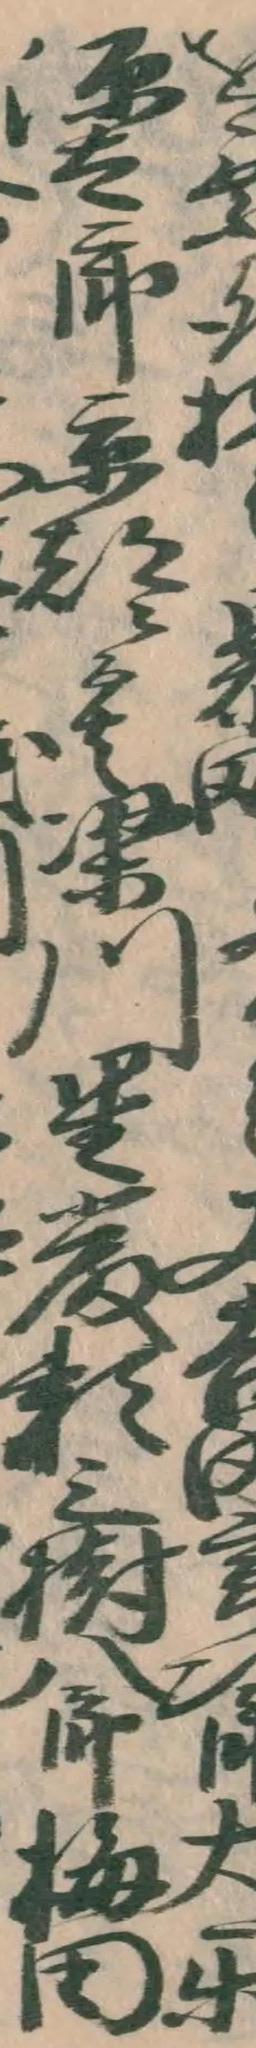源太郎京都ニ而者梁川星厳頼三樹八郎梅田
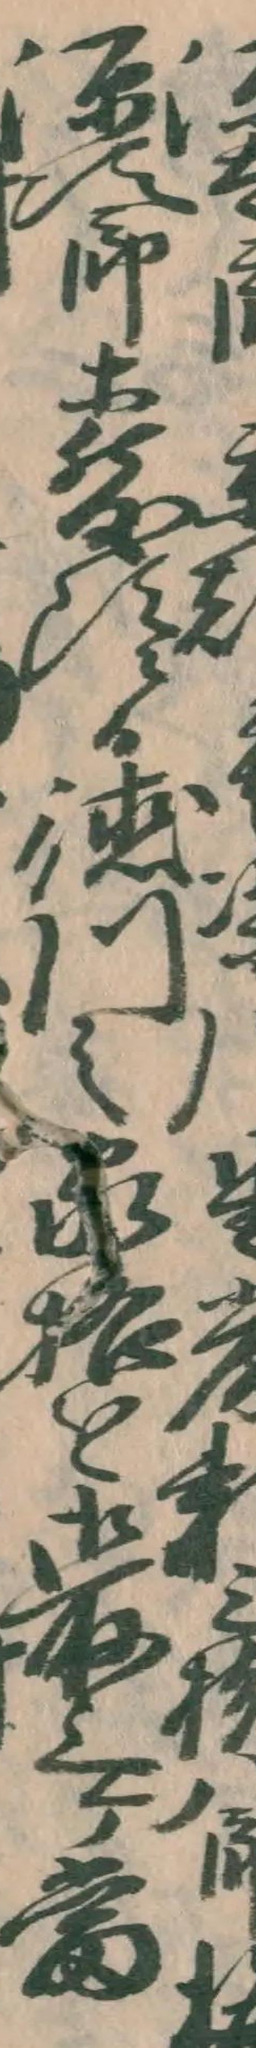源次郎等発頭ニ而徳川之家格を御取上ケ當
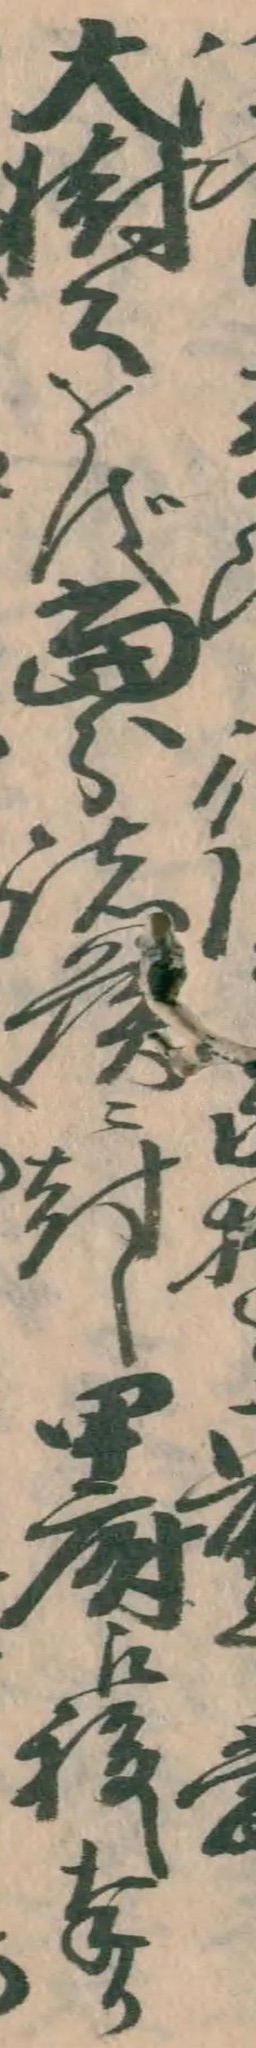大樹公をば當分諸侯ニ封し甲府江移し奉り
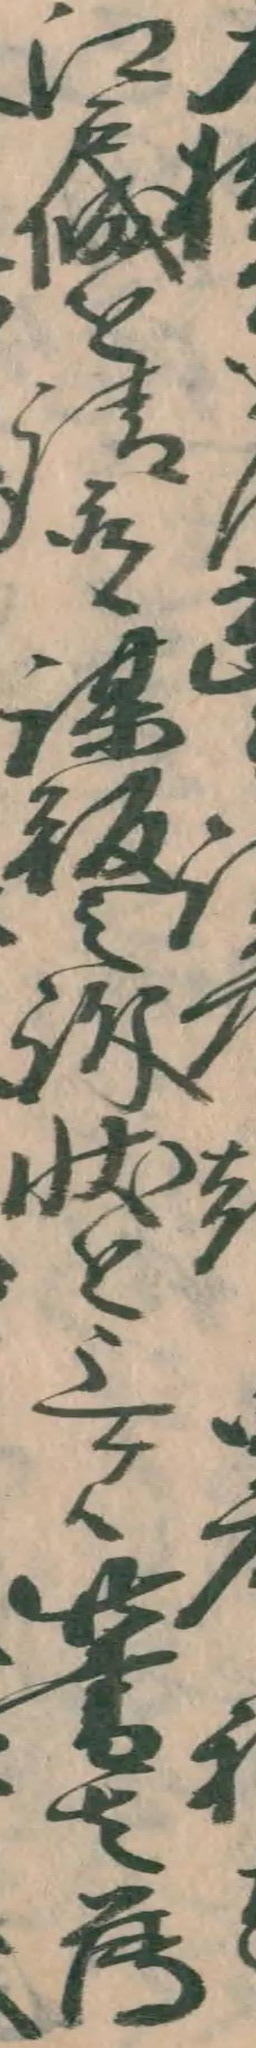江戸城を請取候謀叛之訴状を上ケ候此書者薄
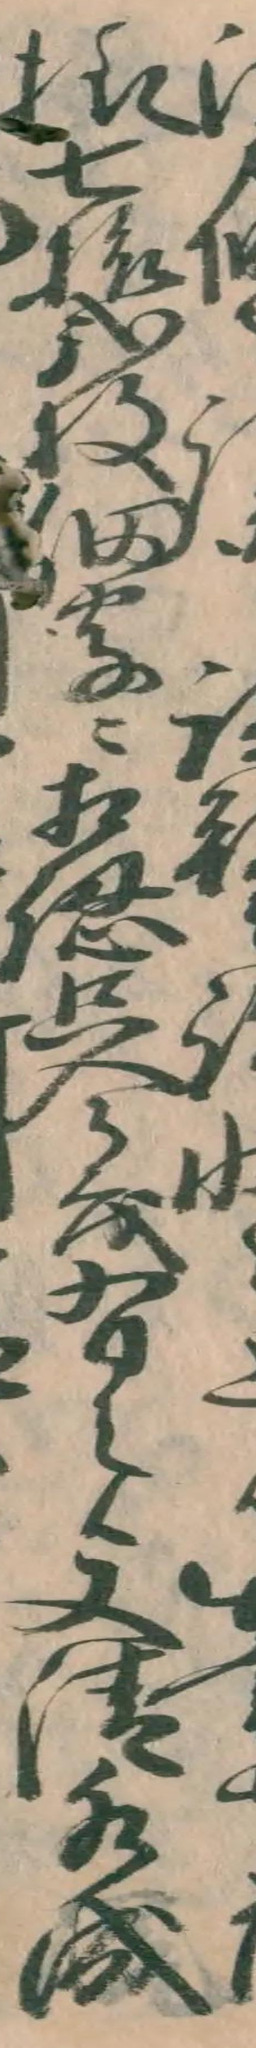様七拾弐枚細字ニ相認只今も有之候又清水成
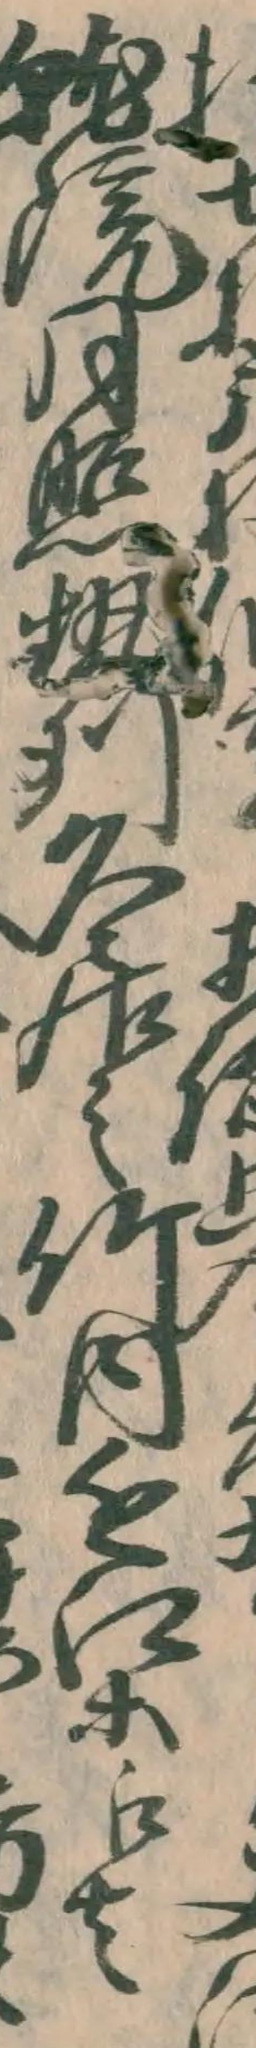就院月照勢州久居之竹内近江等江者
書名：麗斎叢書. 20
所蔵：国立国会図書館 National Diet Library, JAPAN
